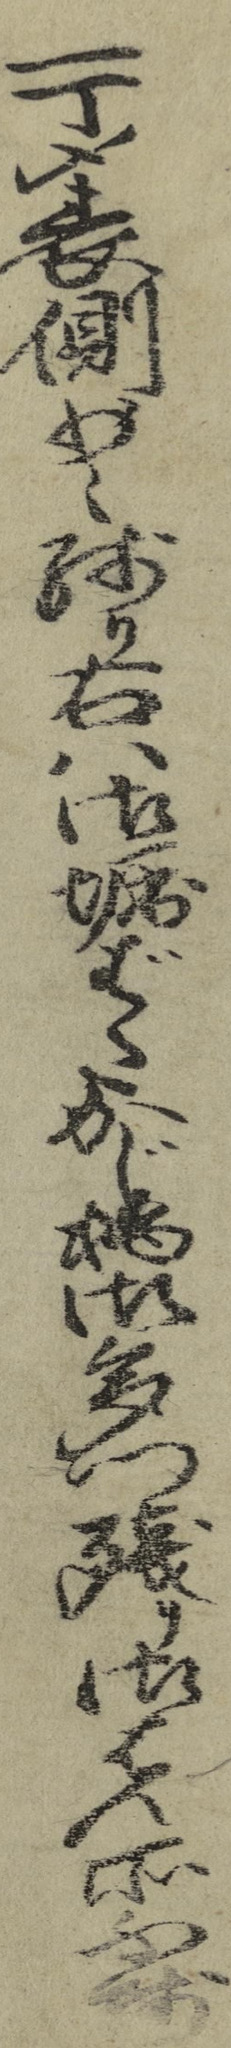一丁メ表側少〻残り右は御堀ばたかじ橋御多門残り御はん所不残
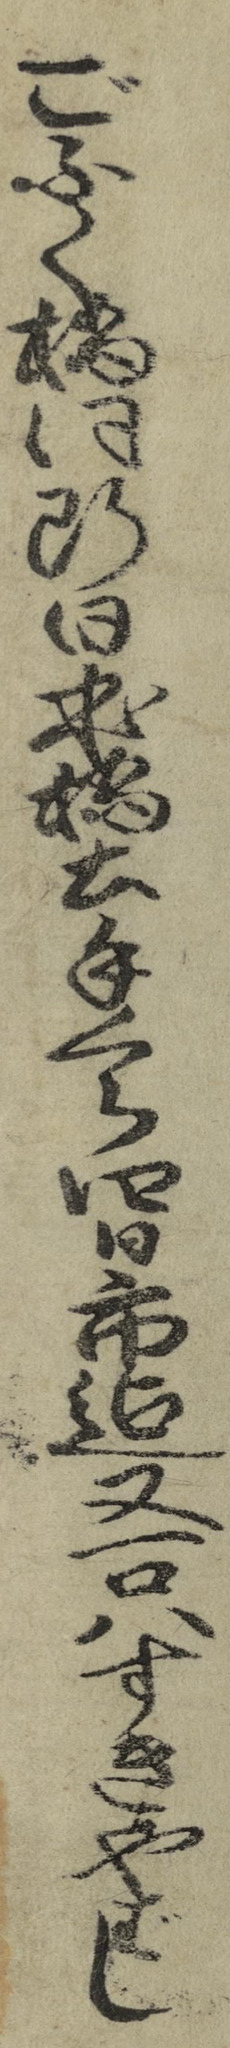ごふく橋同断日本橋土手くら四日市迄又一口はすきやばし
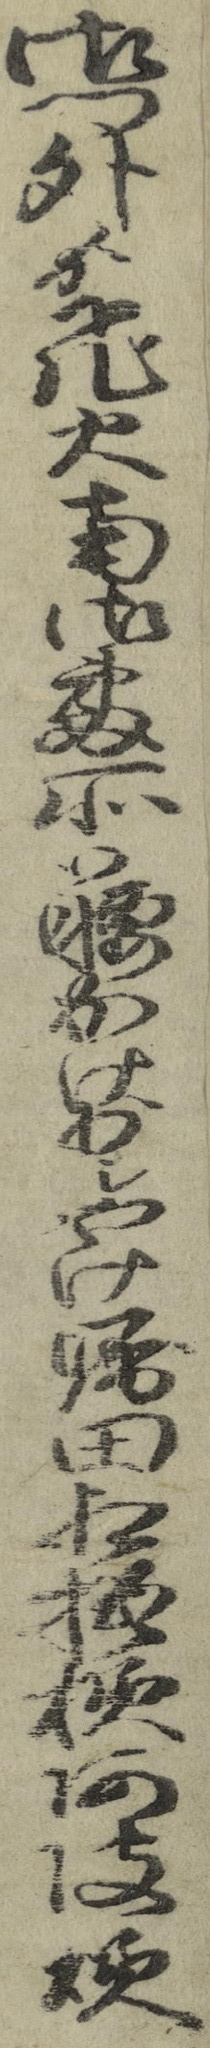御門外ゟ飛火南御番所御腰かけ少シやけ堀田相模様阿波様
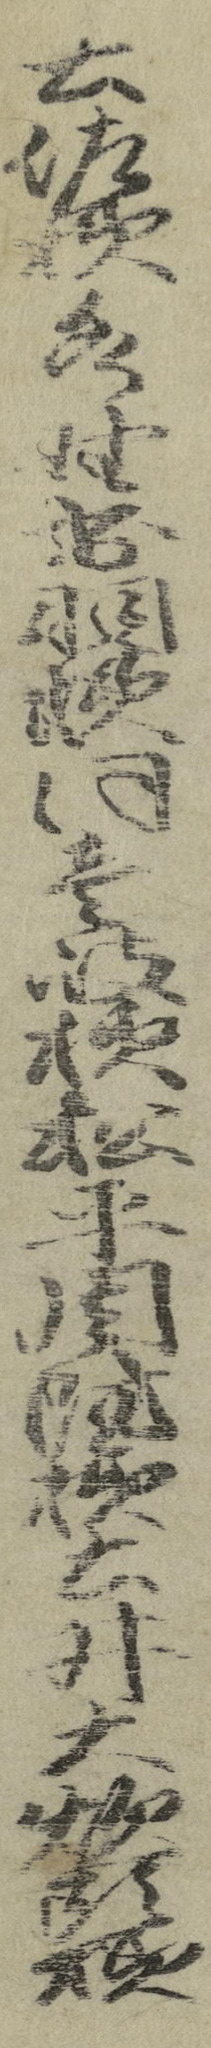土佐様水野出羽様同壱岐様松平周防様土井大煩頭様
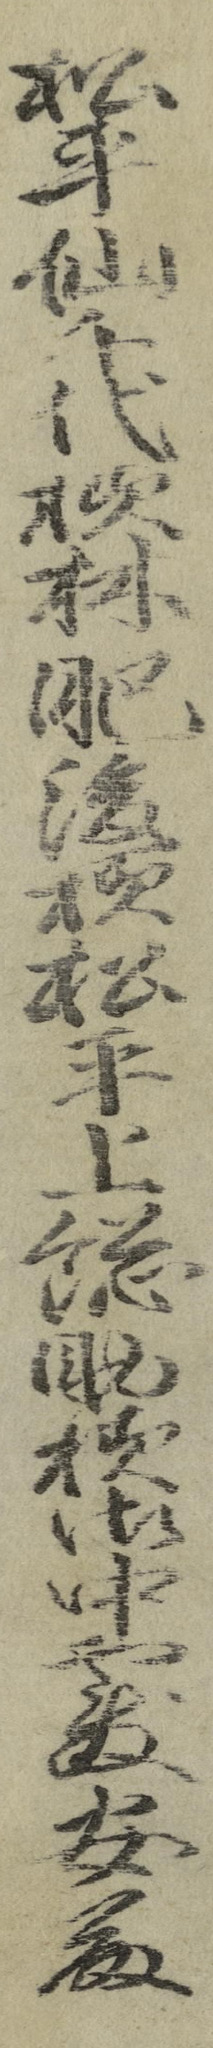松平仙千代様林肥後様松平上総助様御中や敷安藤
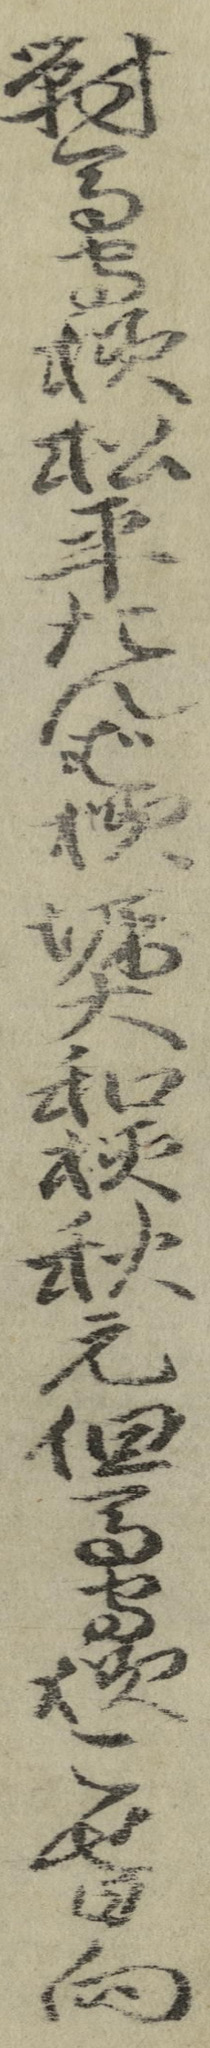対馬守様松平たんば様堀大和様秋元但馬守様こせ日向
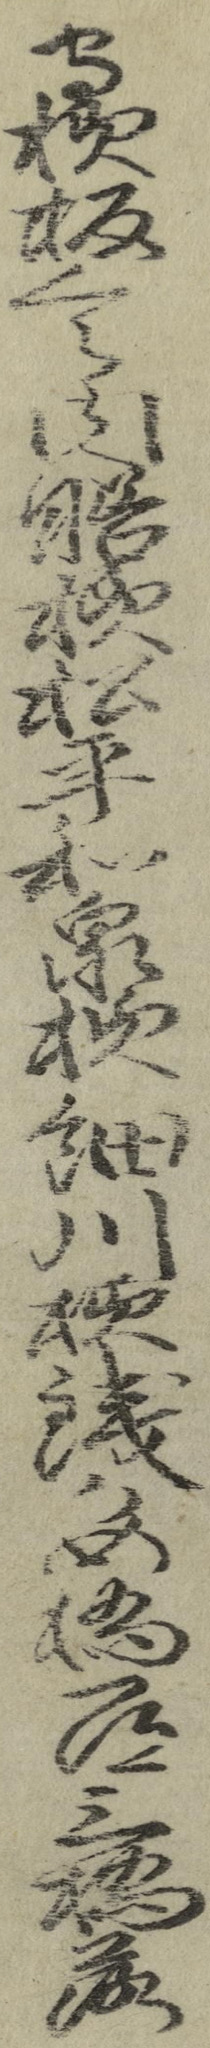守様板くら内膳様松平和泉様細川様銭かめ橋道三橋落
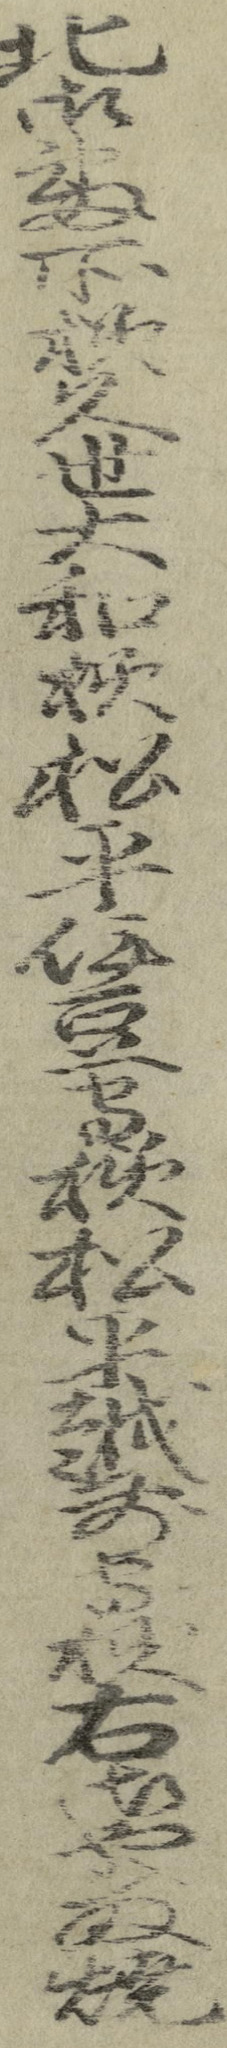北御番所様久世大和様松平伊豆守様松平越前守様右御や敷焼
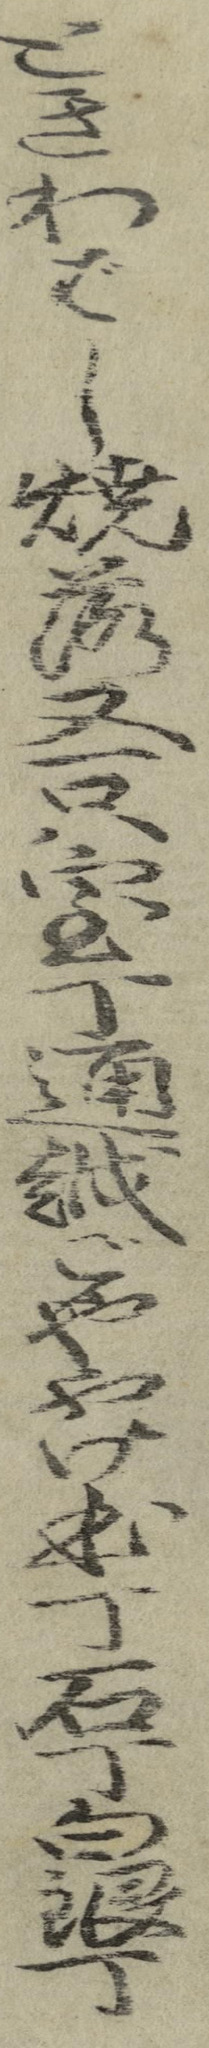ときわばし焼落又一口は宝丁通越ごややけ本丁石丁白銀丁
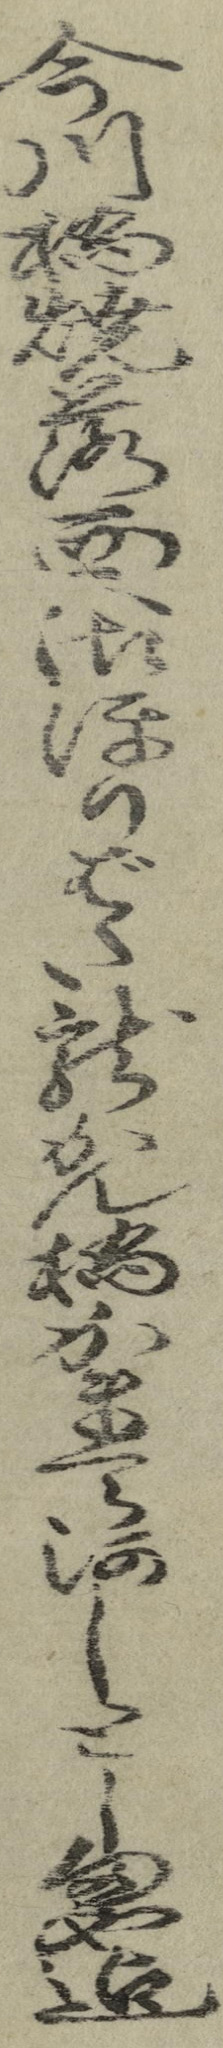今川橋焼落西は御ほりばた龍かん橋かまくら河しとしまや迄
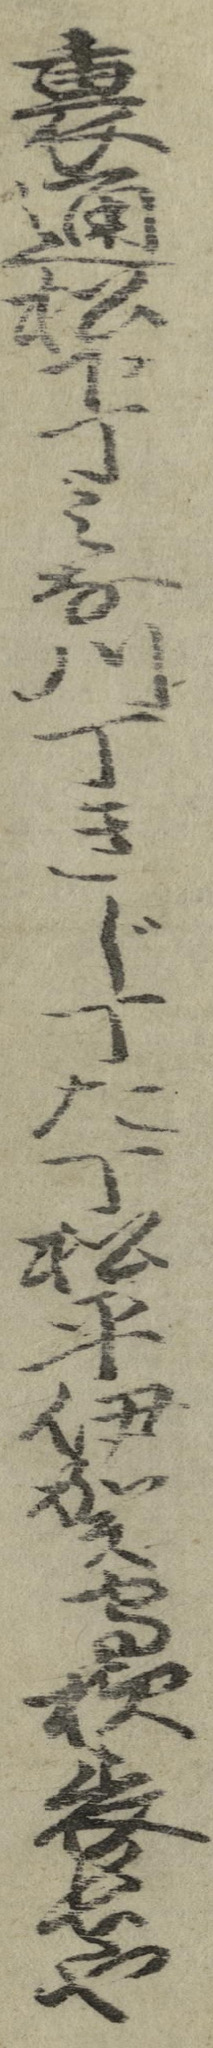裏通松下丁みな川丁きじ丁た丁松平伊賀守様表長や
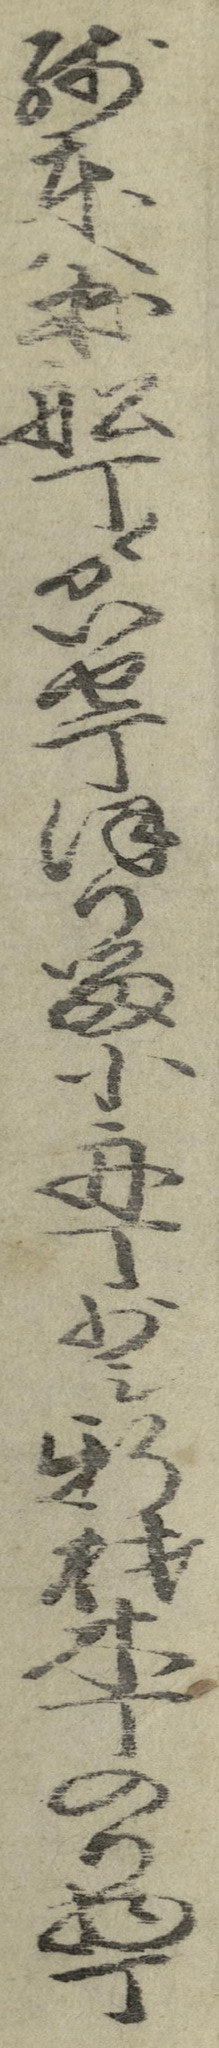残東は本船丁ゟいせ丁ほり留小舟丁少シ新材木丁のり物丁
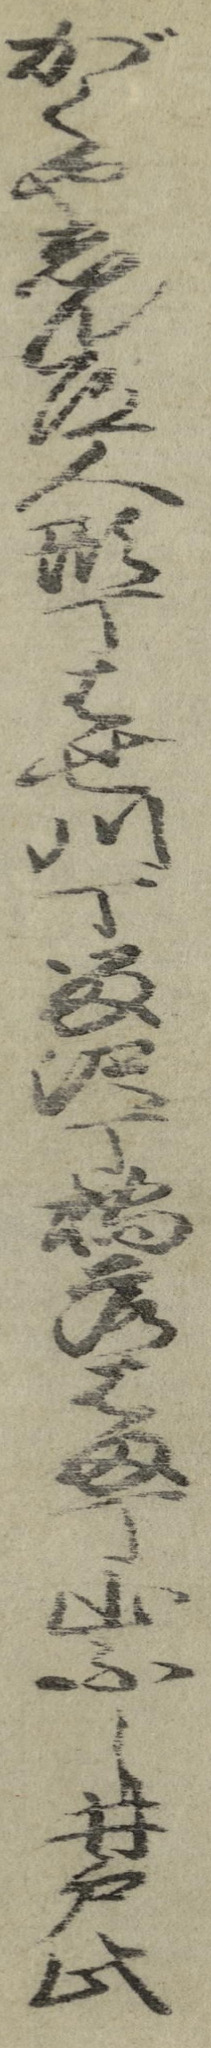がくやしん道人形丁はせ川丁富沢丁橋落はま丁山ふし井戸此
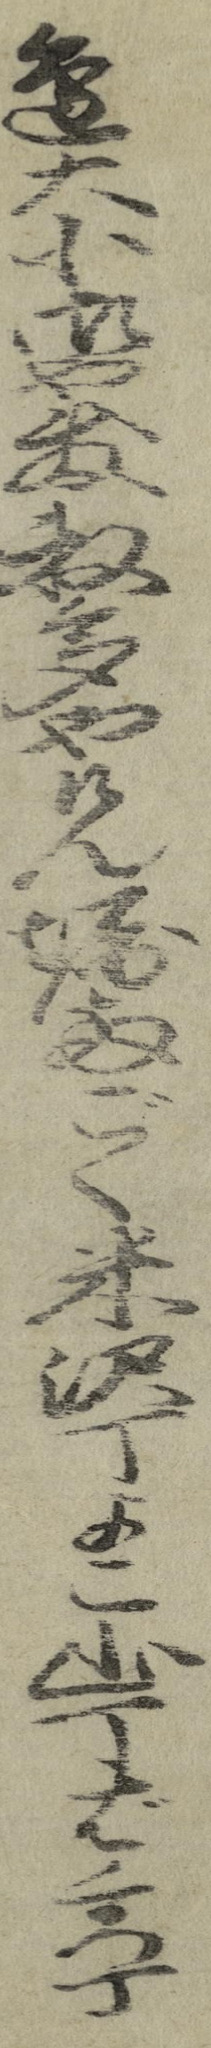辺大小御や敷数多やけん堀両ごく米沢丁よこ山丁ばくろ丁
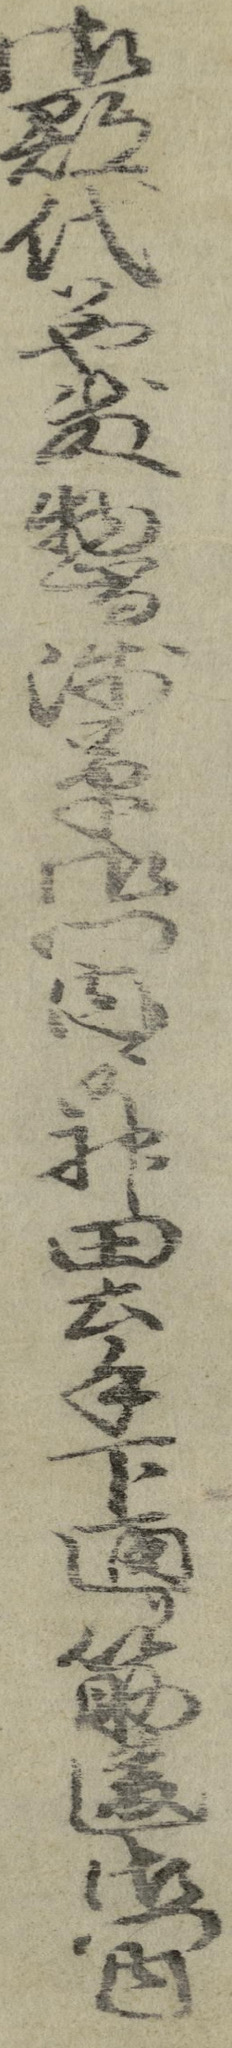御郡代御や敷惣而浅草御門内ゟ神田土手下通り筋違御門内
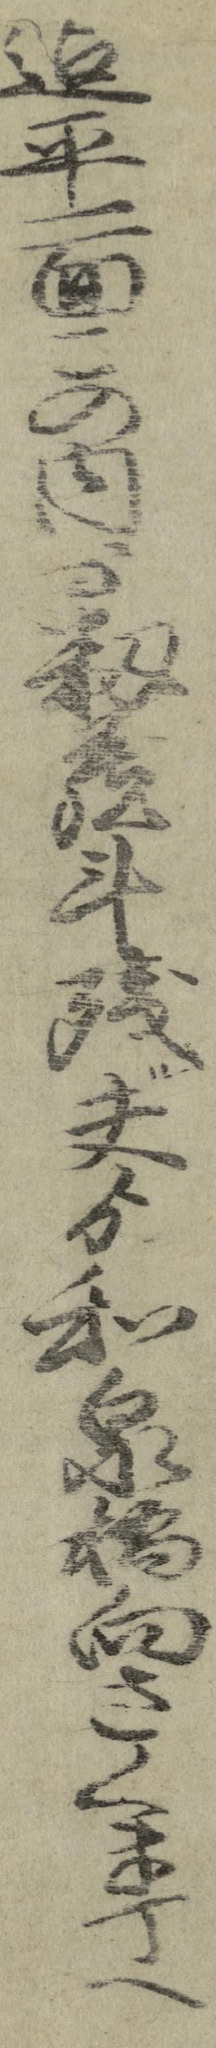迄平一面この内に而籾蔵計残ル夫ゟ和泉橋向さくま丁へ
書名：出火方角場所附
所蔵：東京大学地震研究所図書室 Earthquake Research Institute Library, The University of Tokyo, JAPAN
